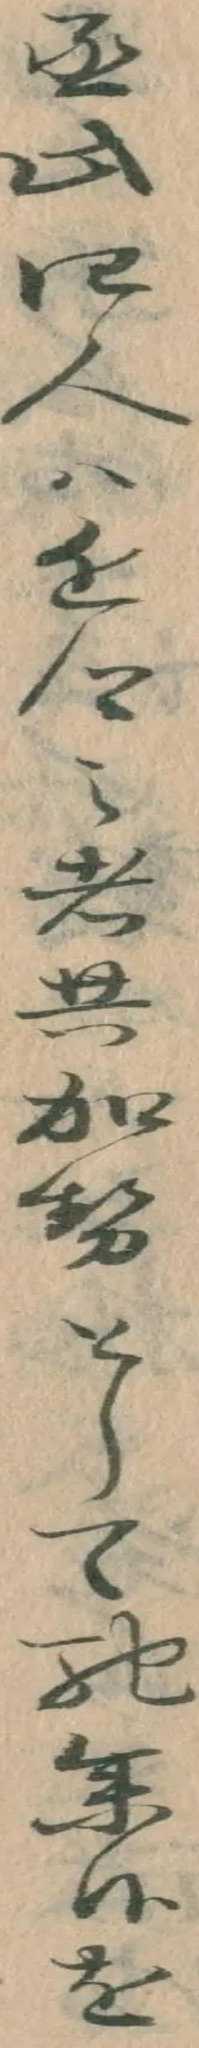丞此四人は近郷之者共加勢として馳参候を
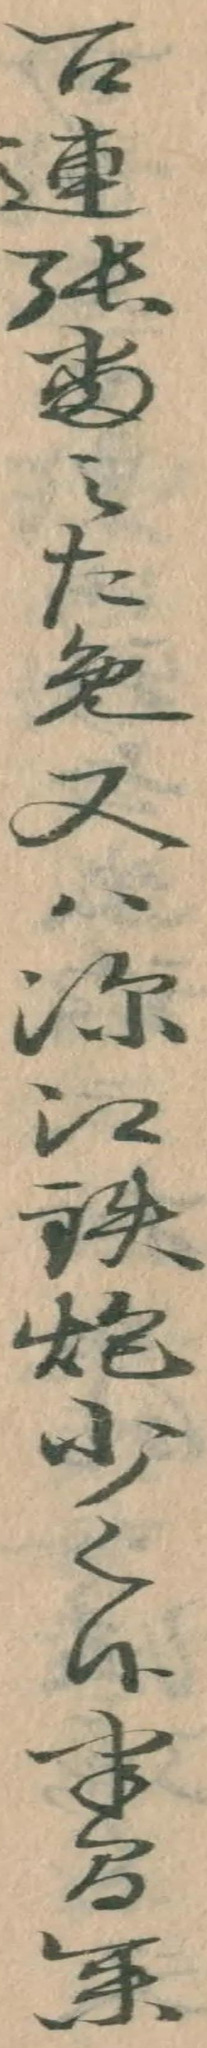召連張番之ため又は深江鉄炮少く候半間参
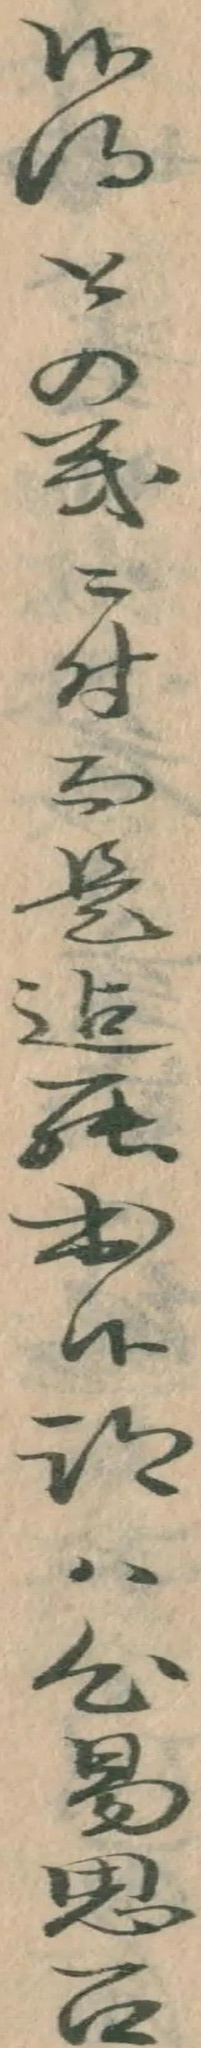候得との義に付而是迄罷出候跡は心易思召
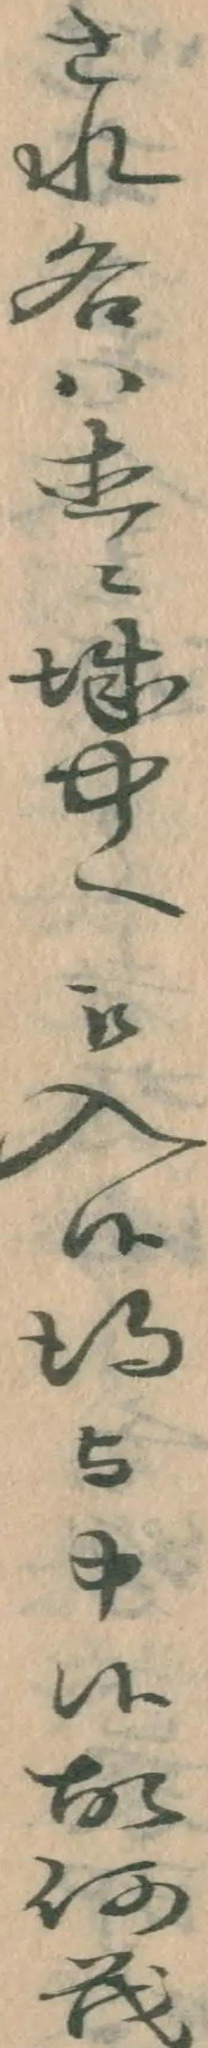され各は直に城中へ被入候与申候故何も
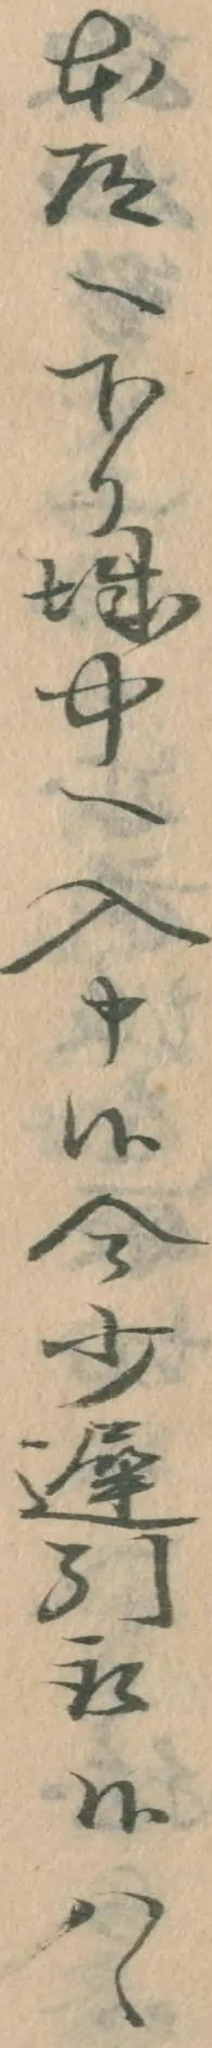本道へ下り城中へ入申候今少遅引取候はゝ

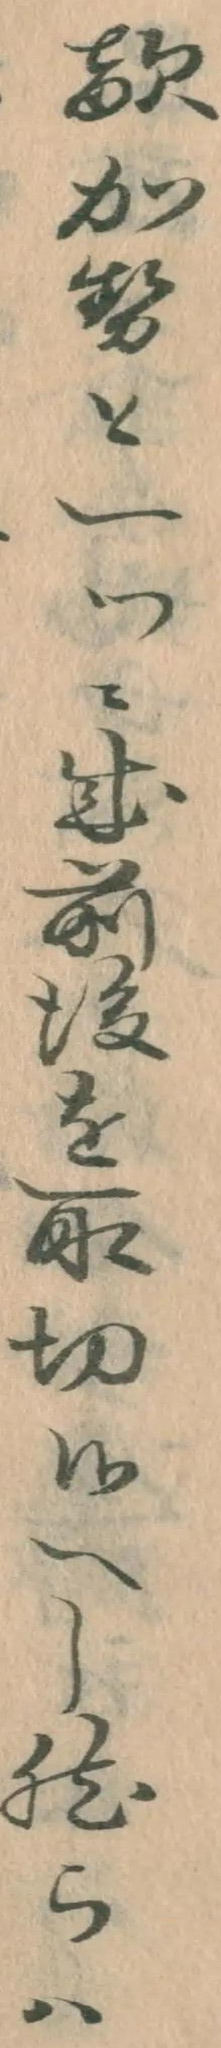敵加勢と一つに成前後を取切候へし然らは
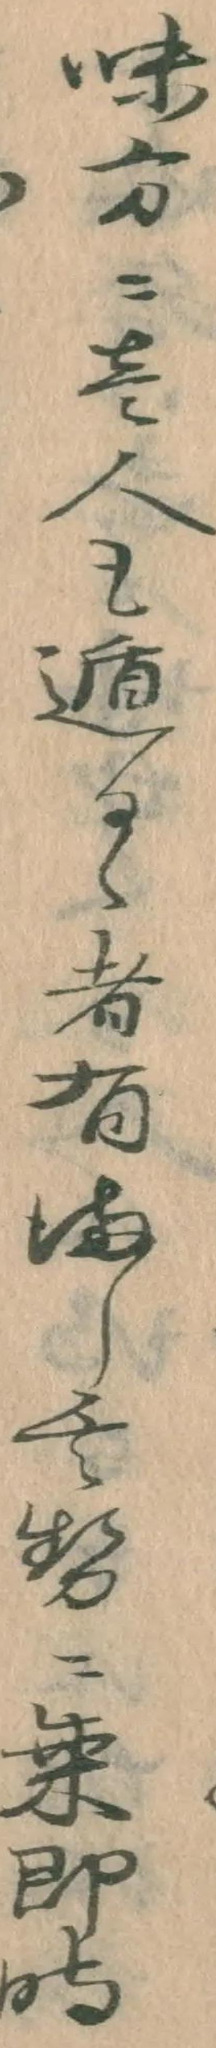味方に壱人も遁るゝ者有まし其勢に乗即時
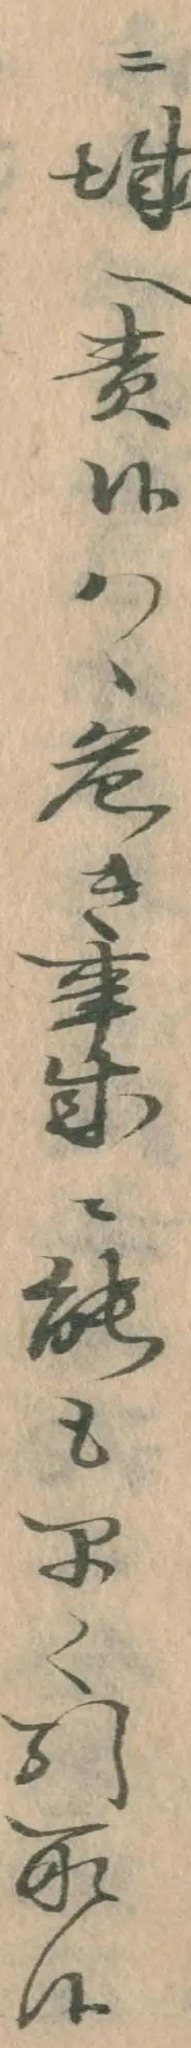に城へ責候はゝ危き事成に能も早く引取候
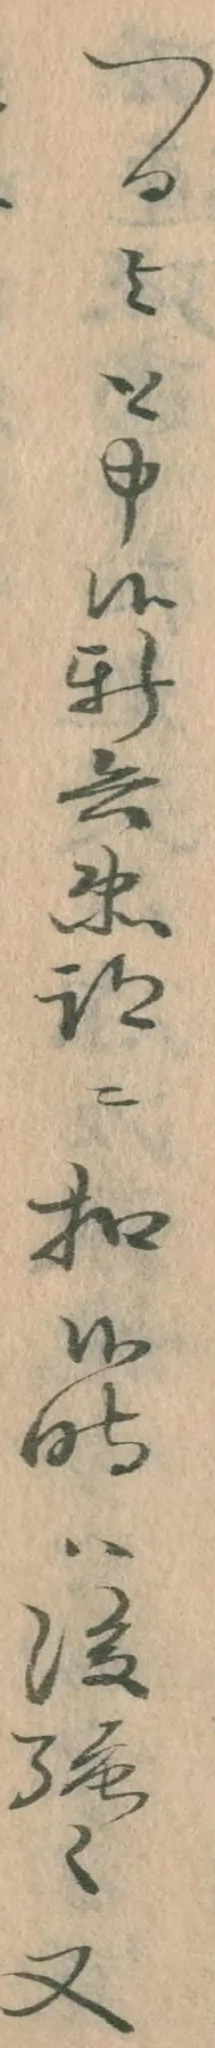つるよと申候新兵衛跡に扣候時は後強く又
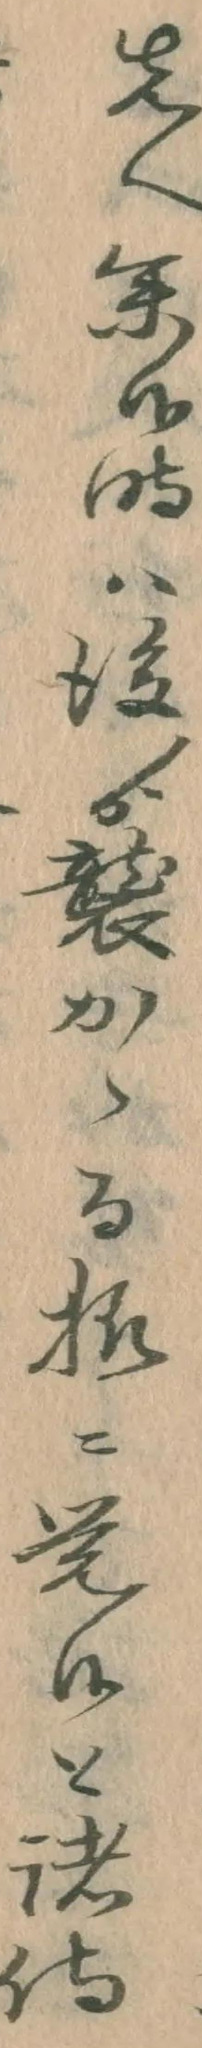先へ参候時は後ゟ襲かゝる様に覚候と諸侍
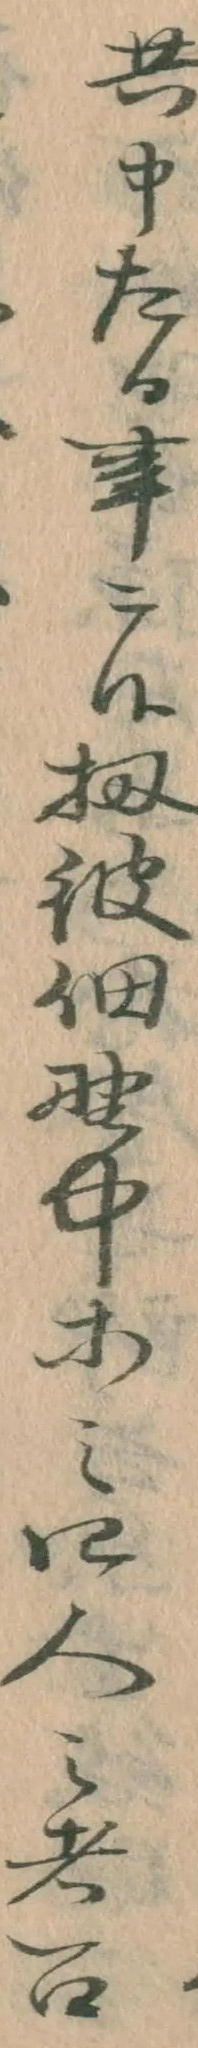共申たる事に候扨彼佃野中等之四人之者召
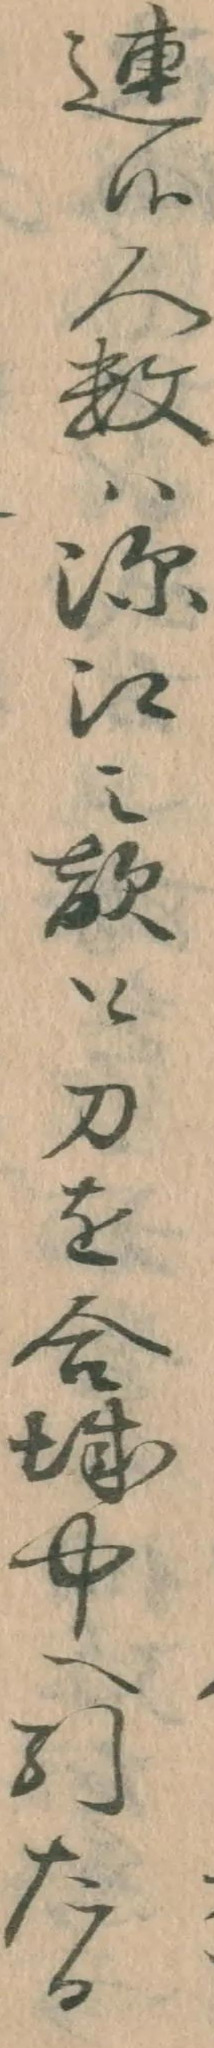連候人数は深江之敵と刀を合城中へ引たる
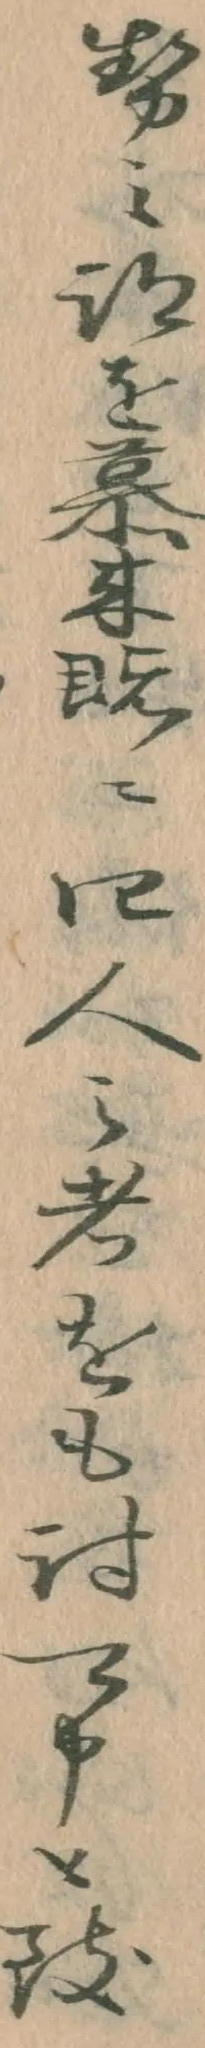勢之跡を慕来既に四人之者をも討可申と致
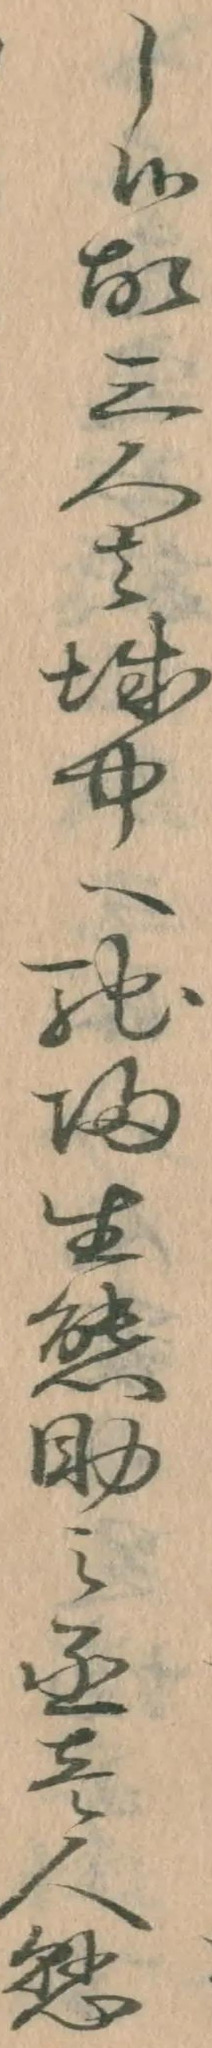し候故三人は城中へ馳帰生熊助之丞壱人懸
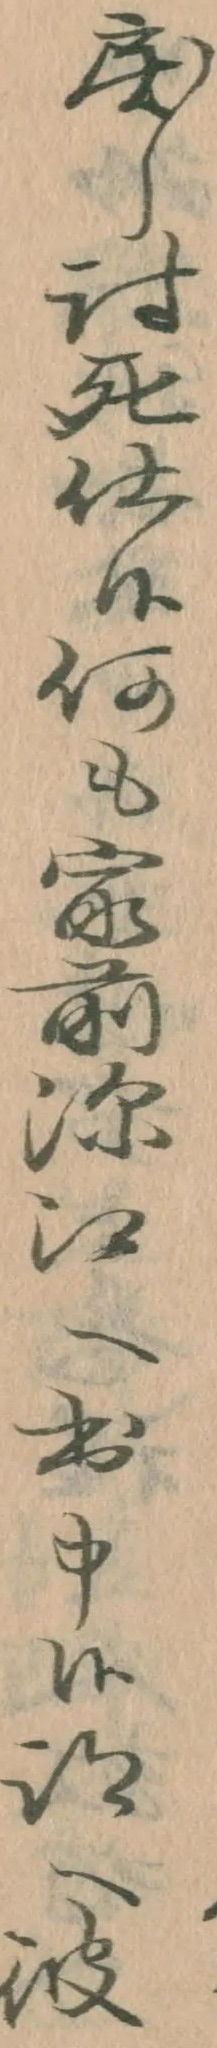戻し討死仕候何も最前深江へ出申候跡へ彼
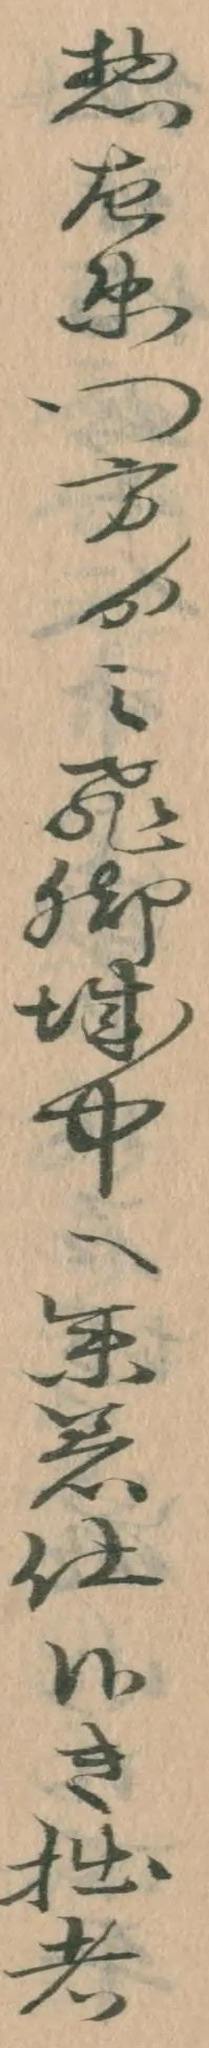惣左衛門方ゟ飛脚城中へ参着仕候き拙者
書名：切支丹御退治記 49巻. [1]
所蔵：国立国会図書館 National Diet Library, JAPAN
